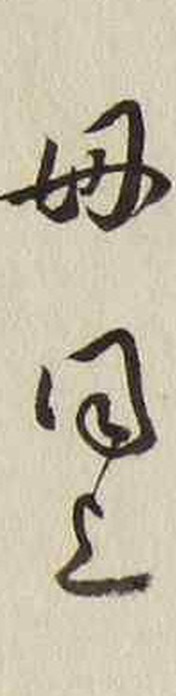母同上

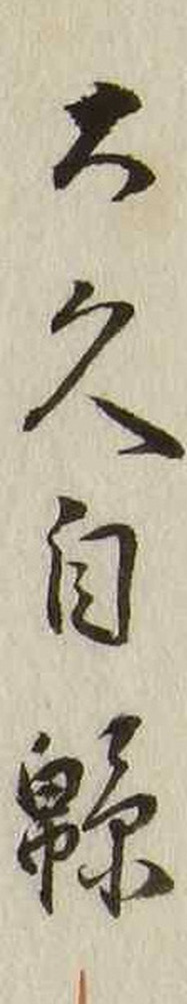大久自緜
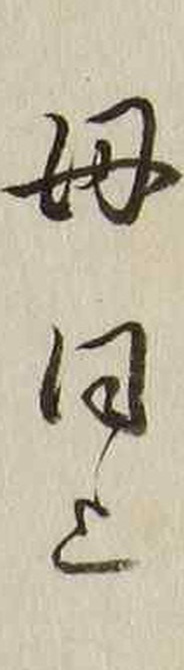母同上
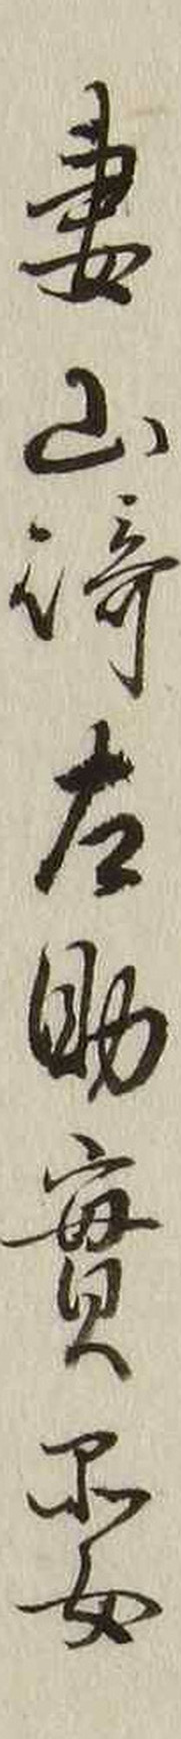妻山崎左助実品女
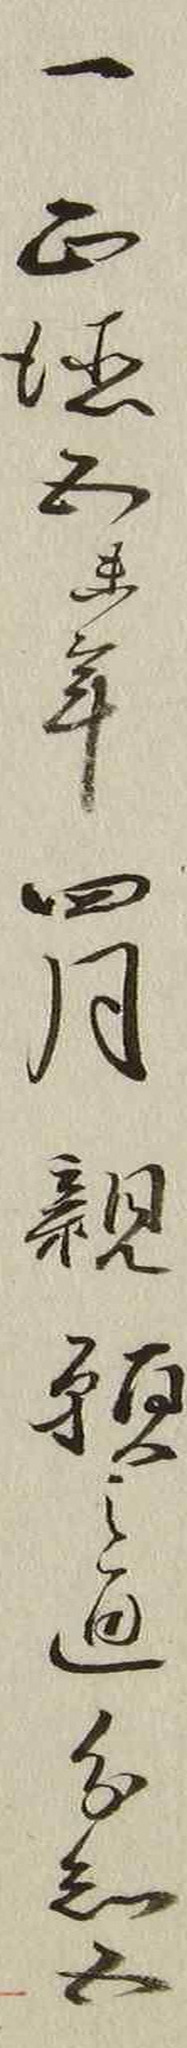一正徳五未年四月親願之通分知五
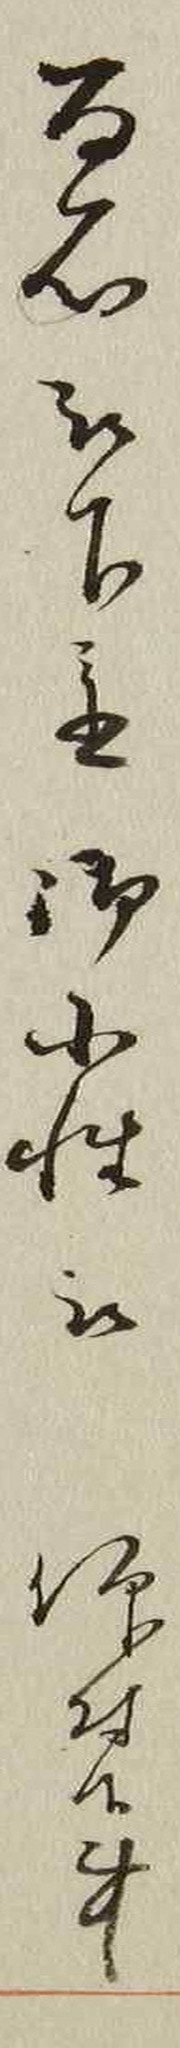百石被下置御小姓被仰付候事
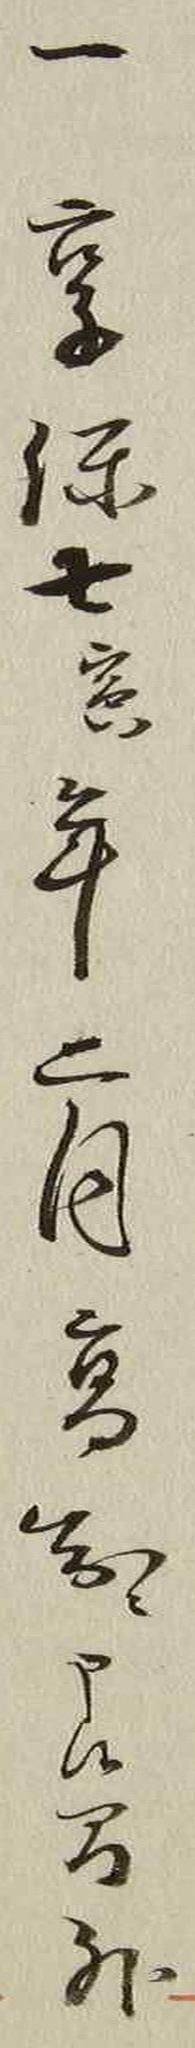一享保七寅年二月高知に申候間外
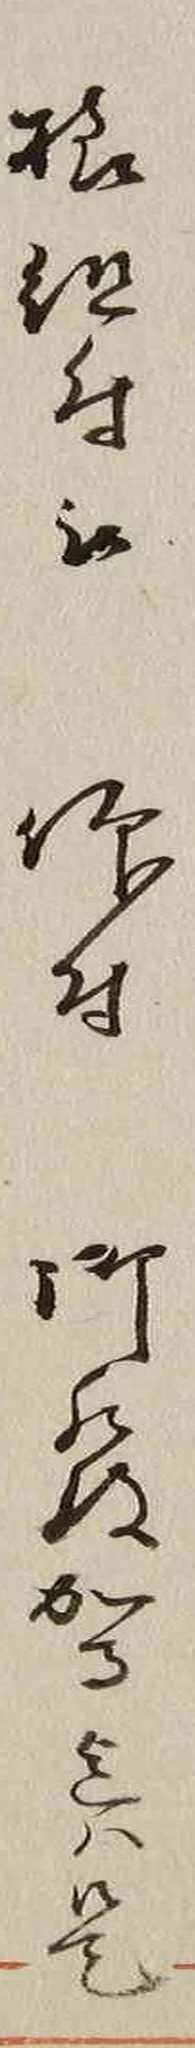様組付被仰付御發駕迄は是
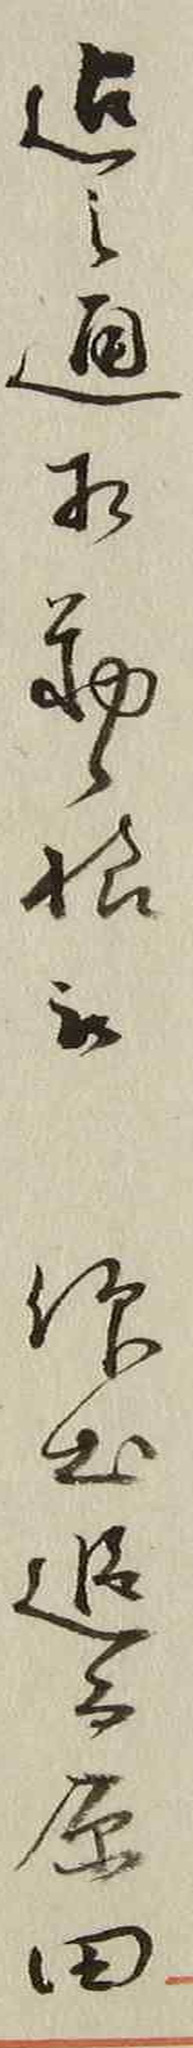迄之通相勤候様被仰出追而原田
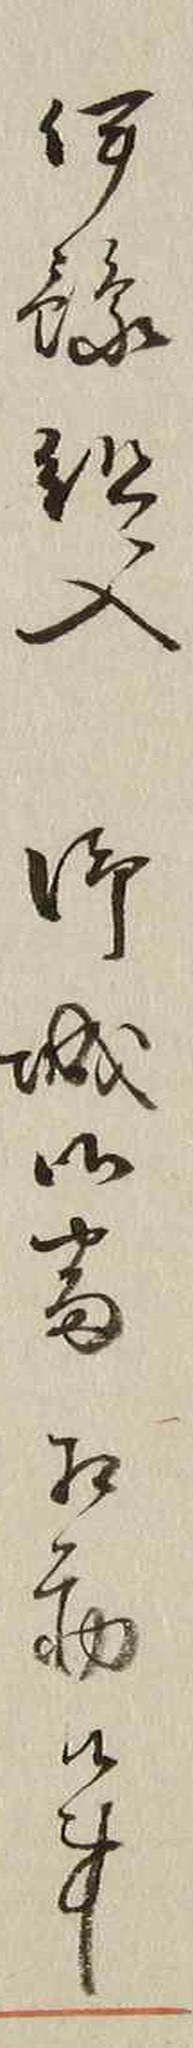伊豫組へ入御城御番相勤候事
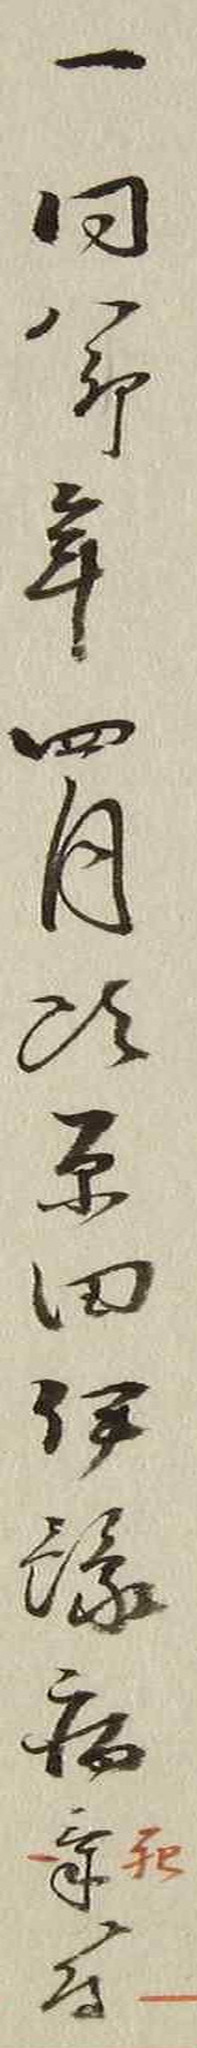一同八卯年四月頭原田伊伊豫病気に付
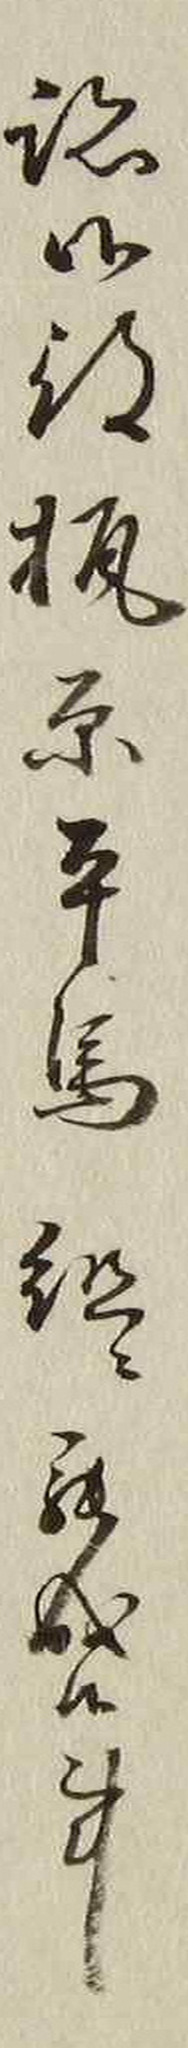跡御役梶原平馬組に被成候事
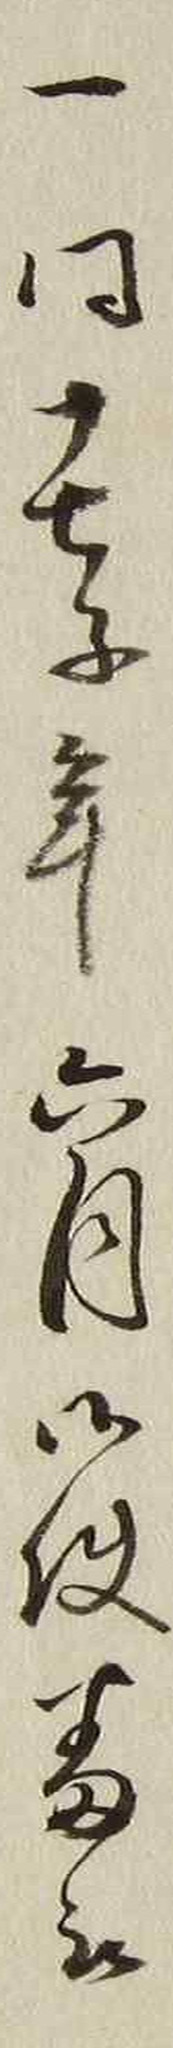一同十七子年六月御使番被
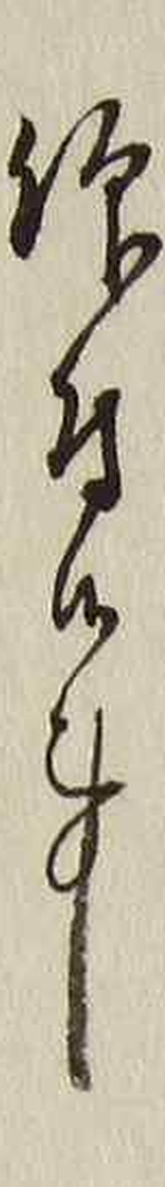仰付候事
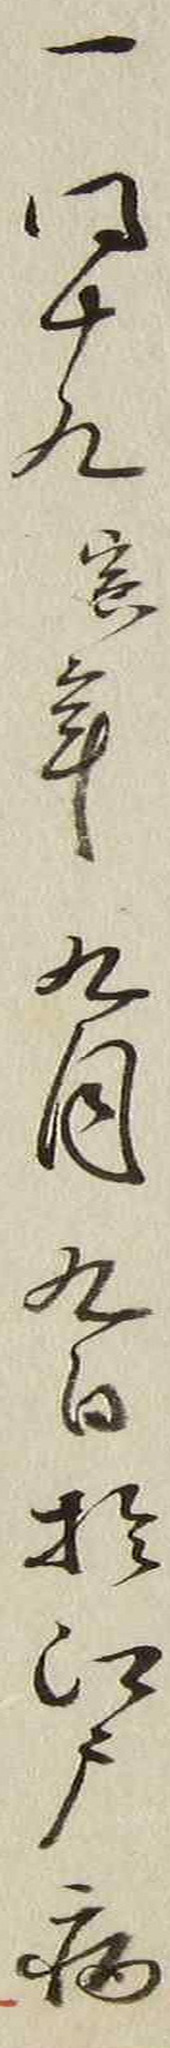一同十九寅年九月九日於江戸病
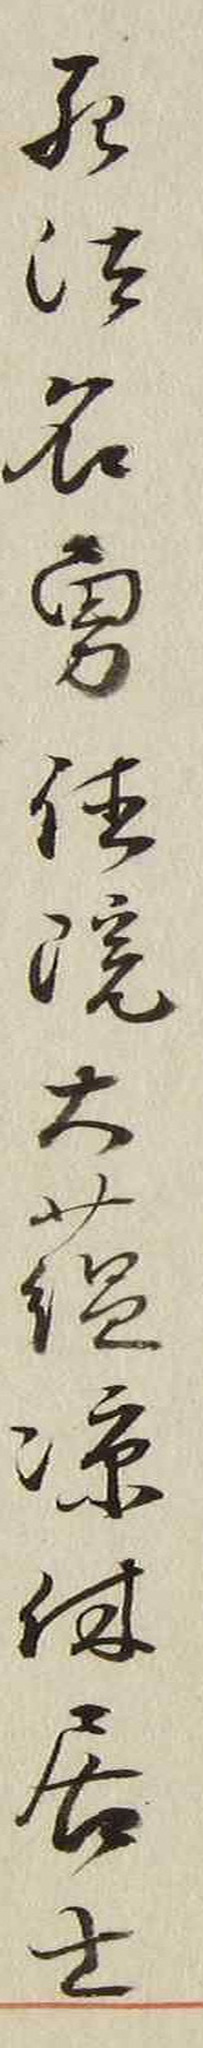死法名勇徳院大蘊涼休居士
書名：諸士系譜　巻之159　な之部1
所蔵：会津若松市立会津図書館
